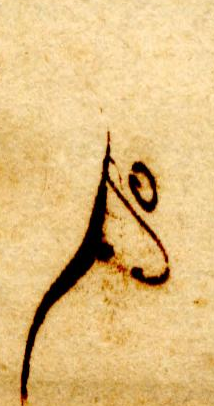To
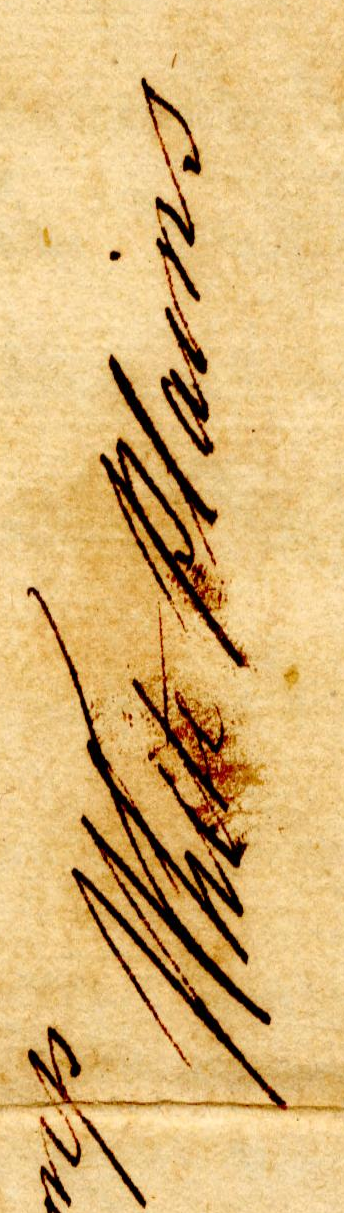White Plains
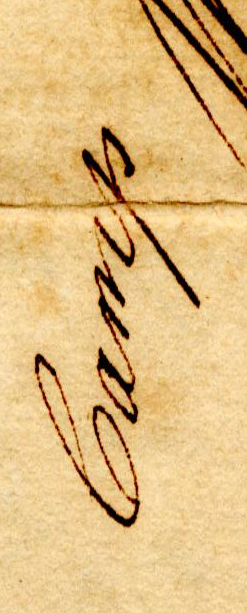Camp
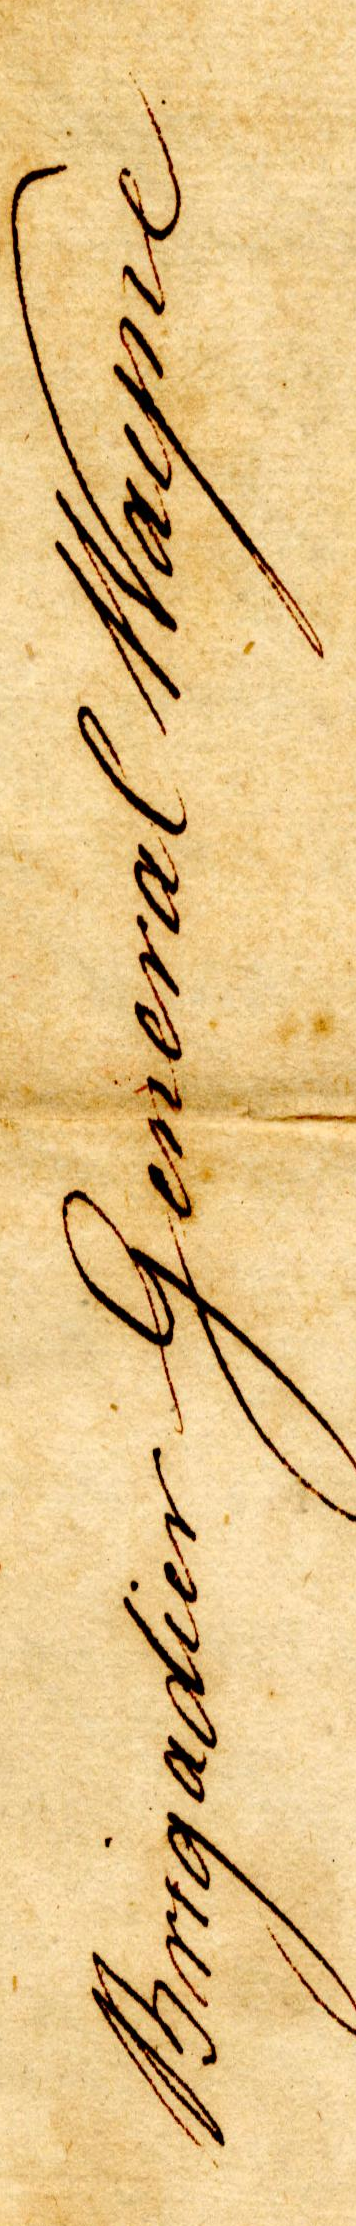Brigadier General Wayne
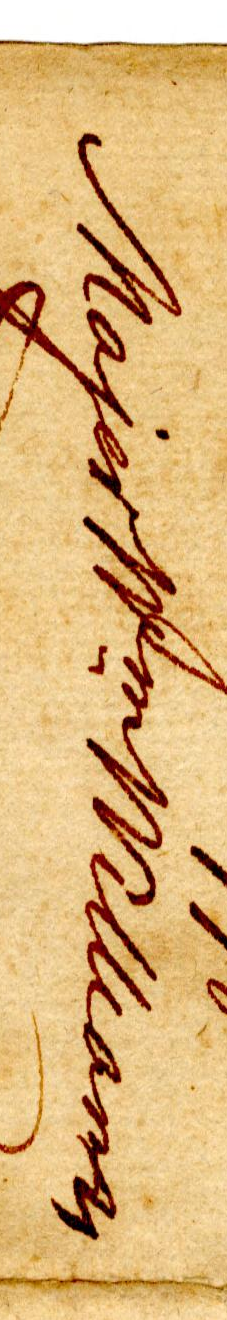Major W^m. Williams
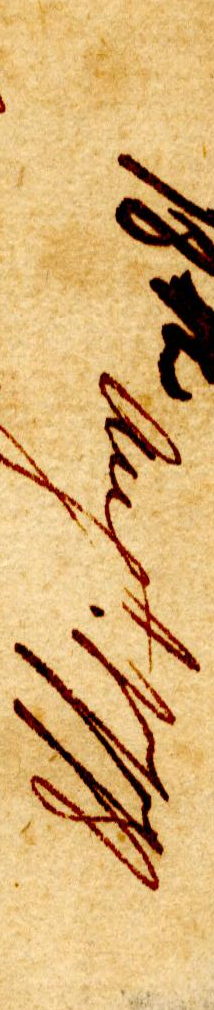18^th Aug^t. 1778
